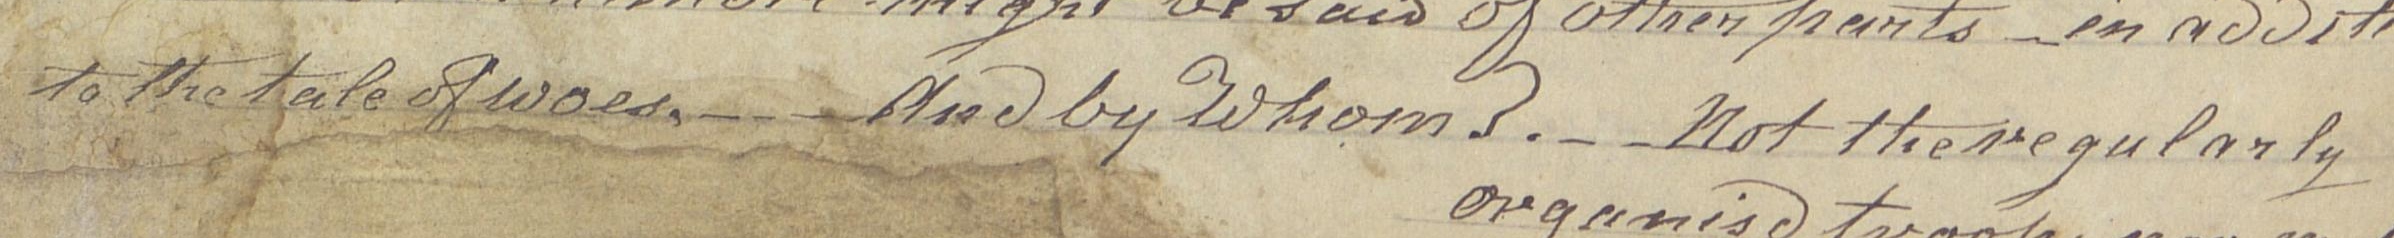to the tale of Woes. And by Whom? Not the regularly
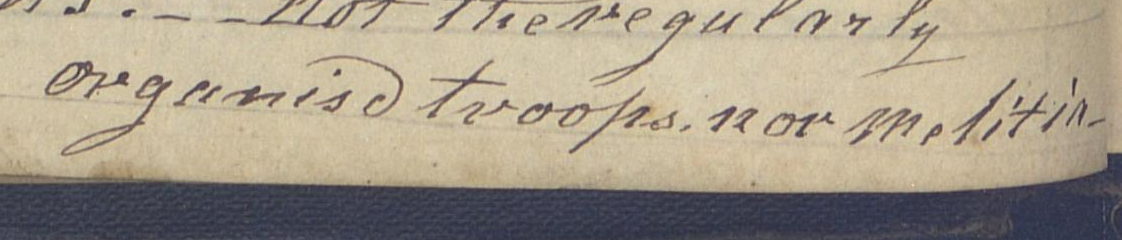organisd troops nor militia
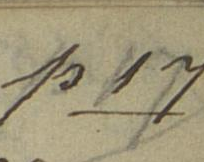p 17
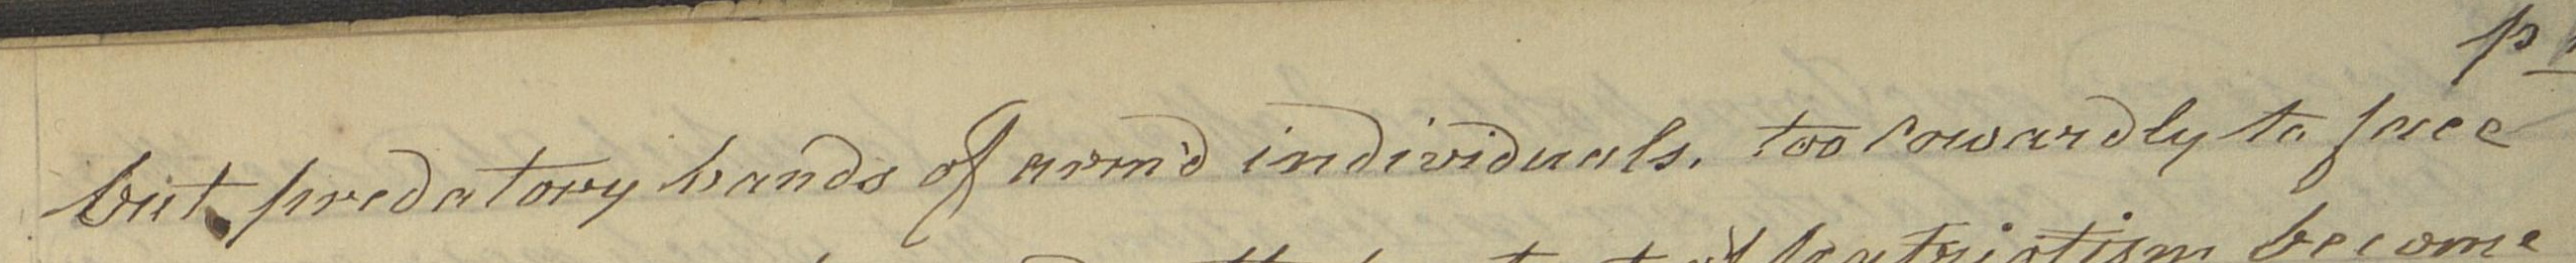bust predatory bands of arm'd individuals too cowardly to face
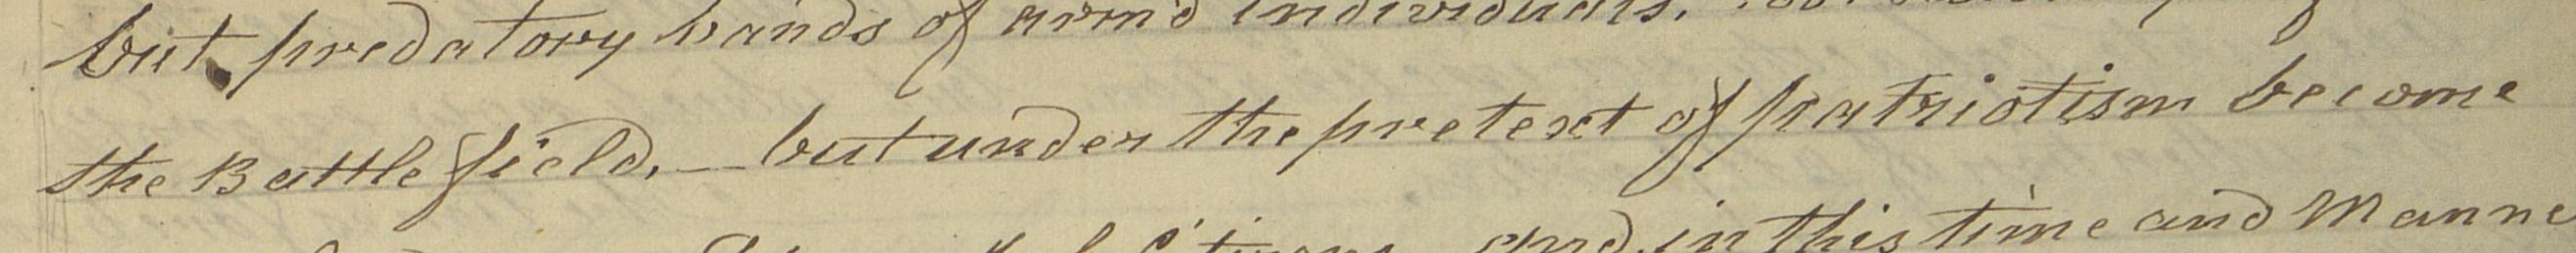the Battle field, but under the pretext of patriotism become
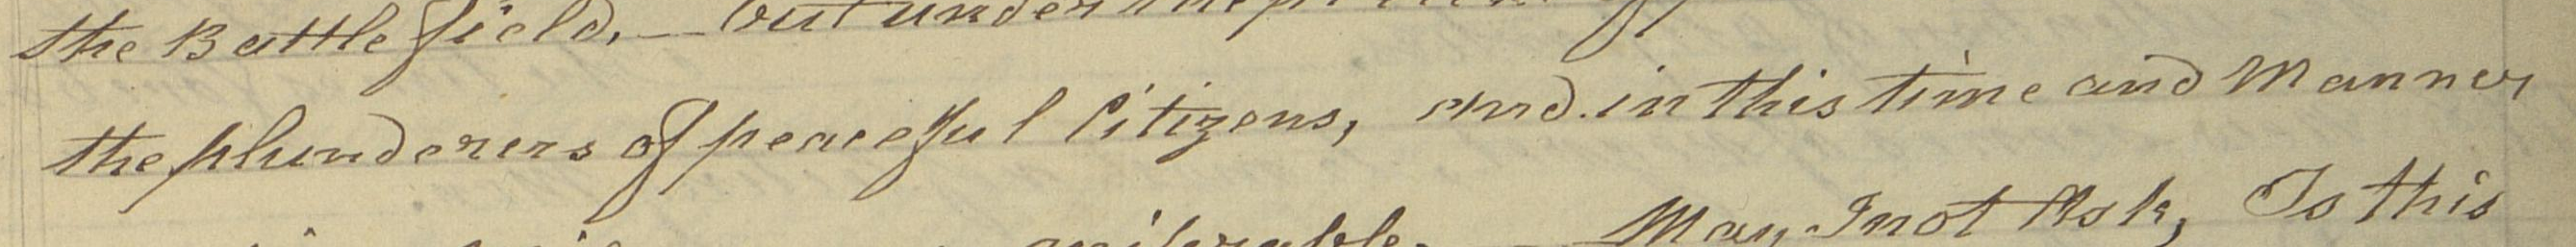the plunderers of peaceful Citizens, and in this time and Manner
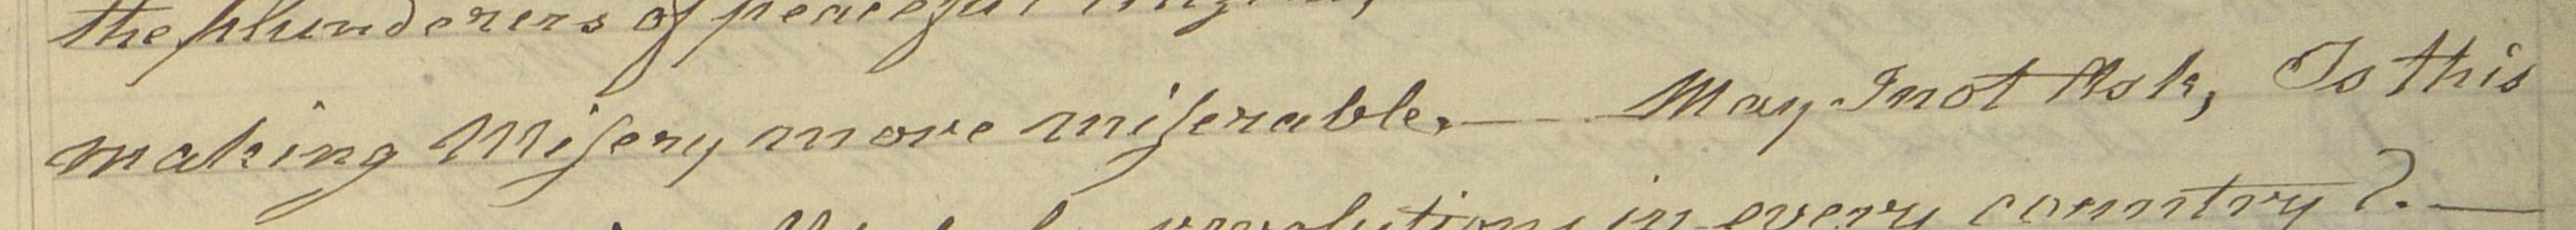making Misery more miserable. May I not Ask, To this
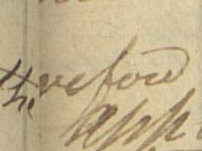-efore
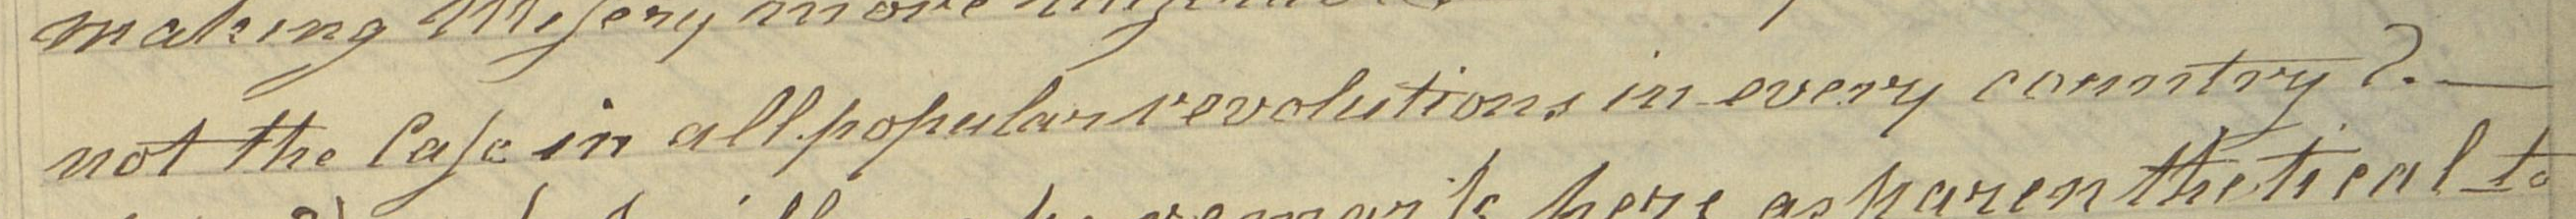not the Case in all popular revolutions in every country?
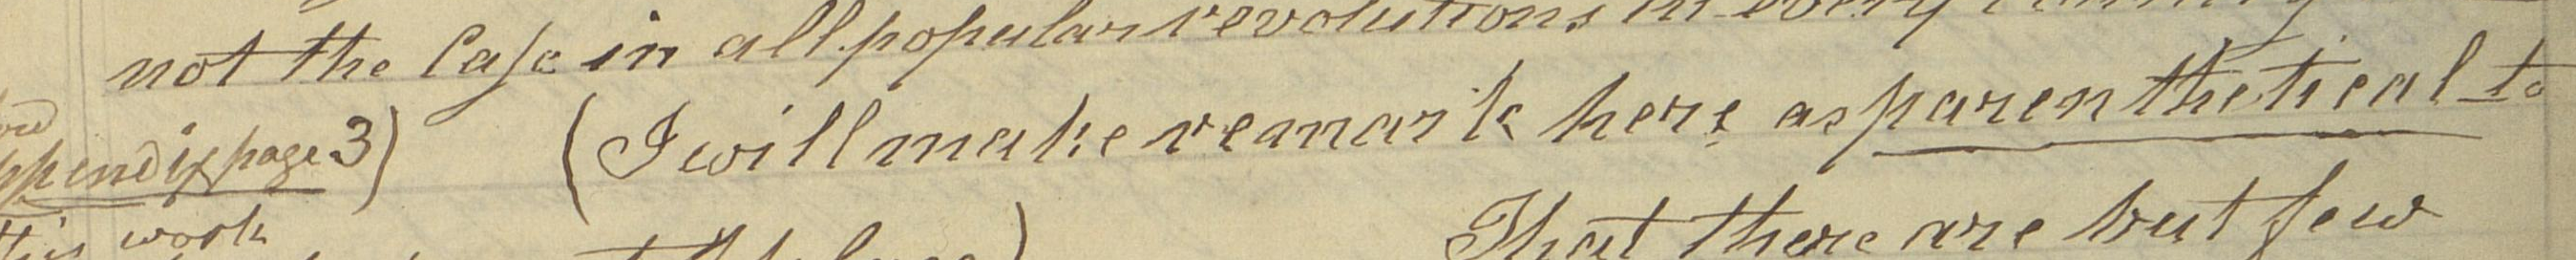Appendix page 3) (I will make remark here as parenthetical to
